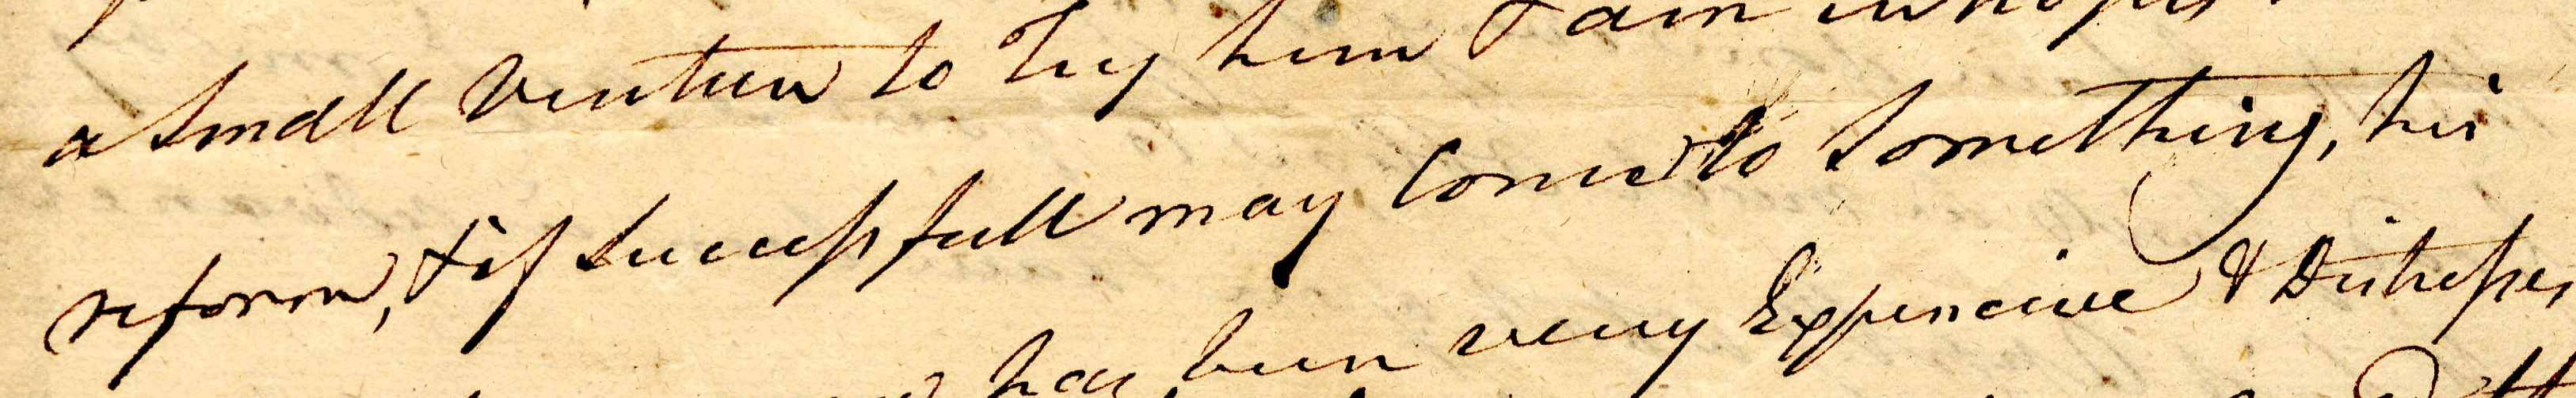reform, & if successfull may come to something, his
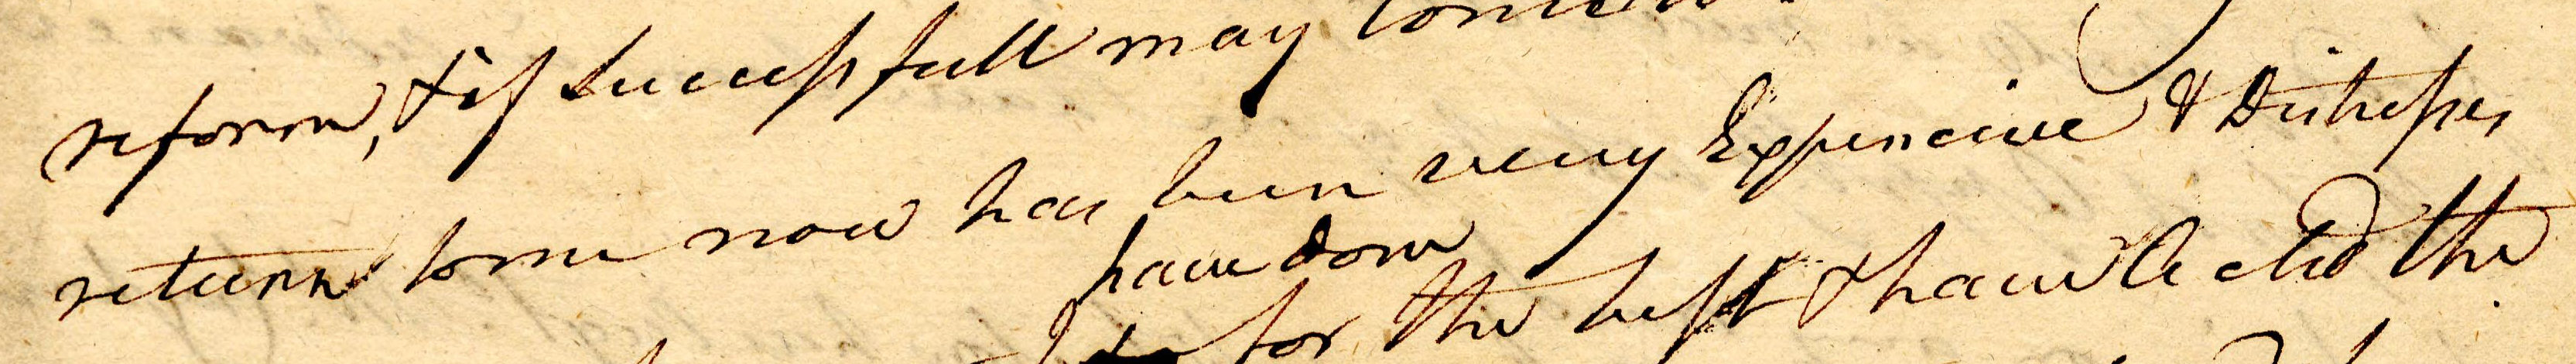return to me now has been very Expensive & Distresses
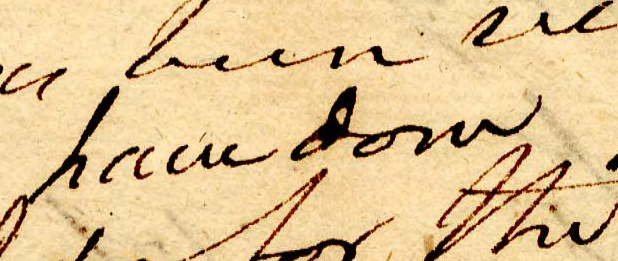have done
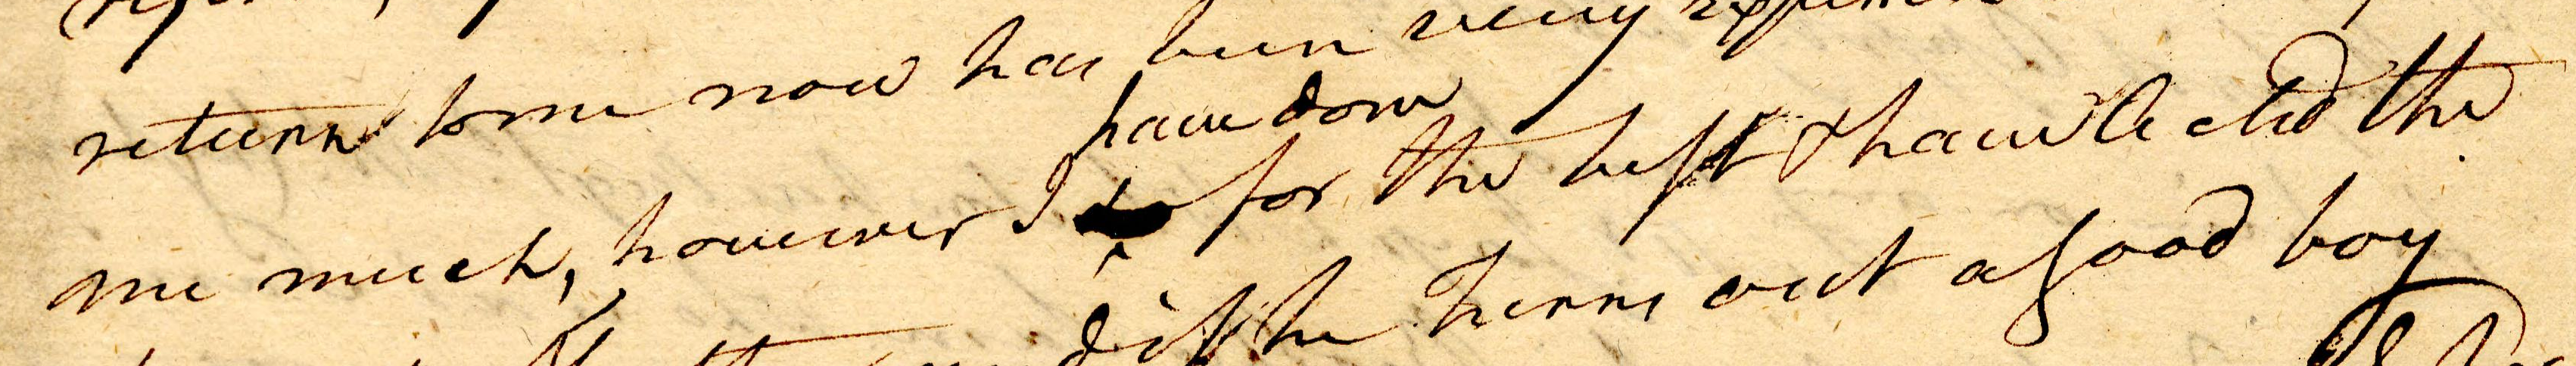me much, however I [do] ^for the help & have Acted the
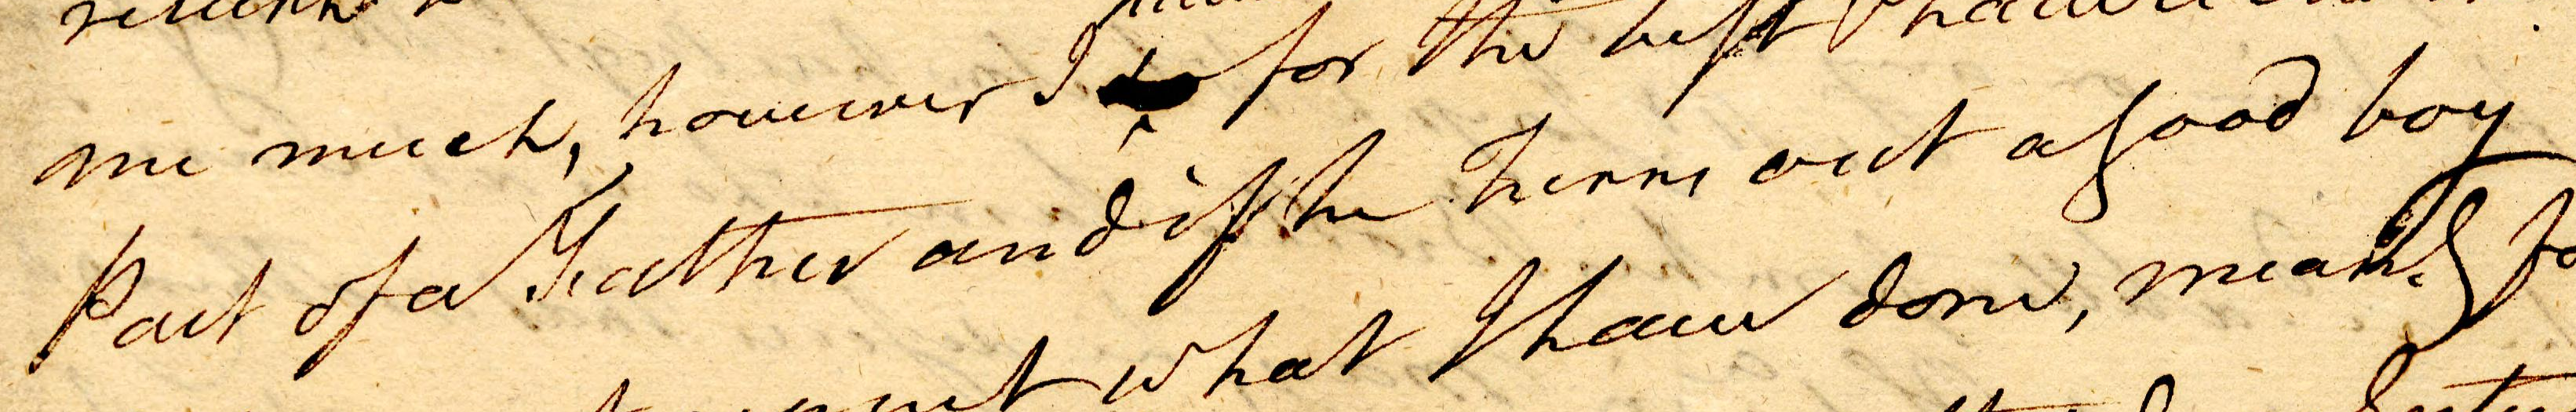Part of a Father and if he Turns out a good boy
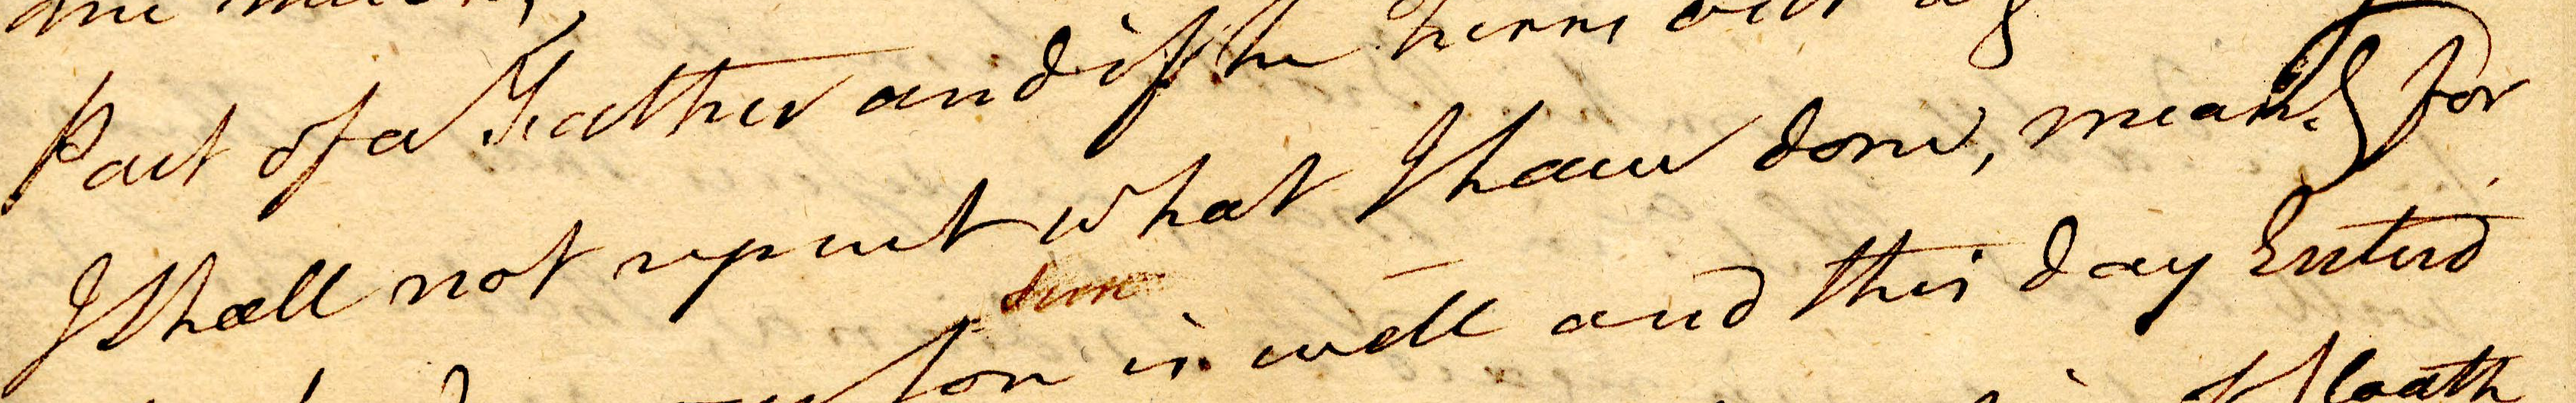I shall not repeat what I have done, mean^g. for
